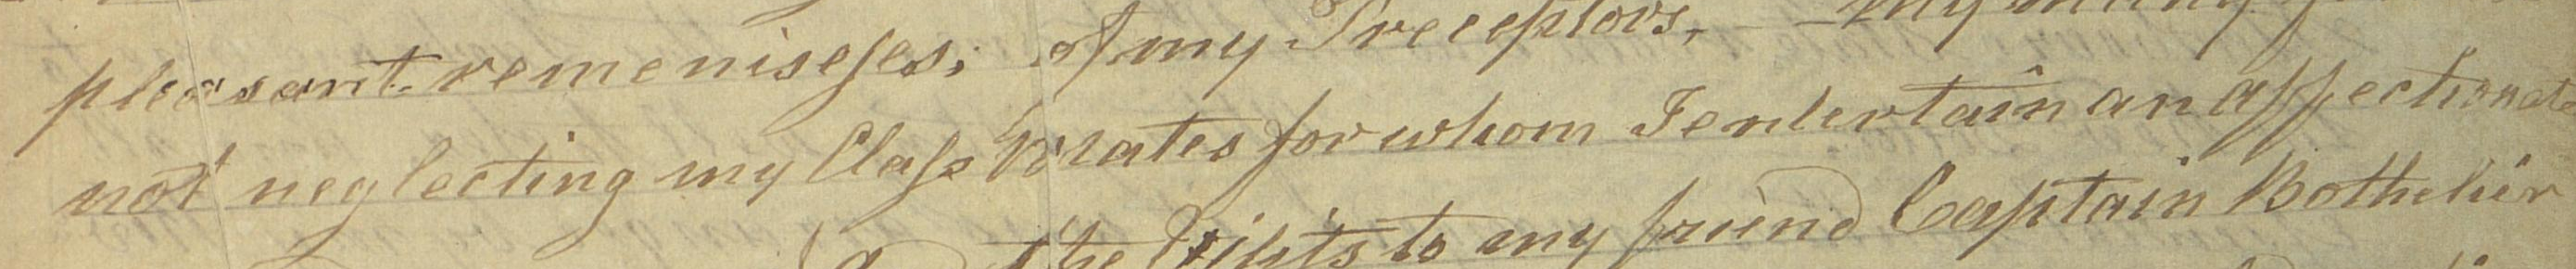not neglecting my Class Mates for whom I entertain an affectionate
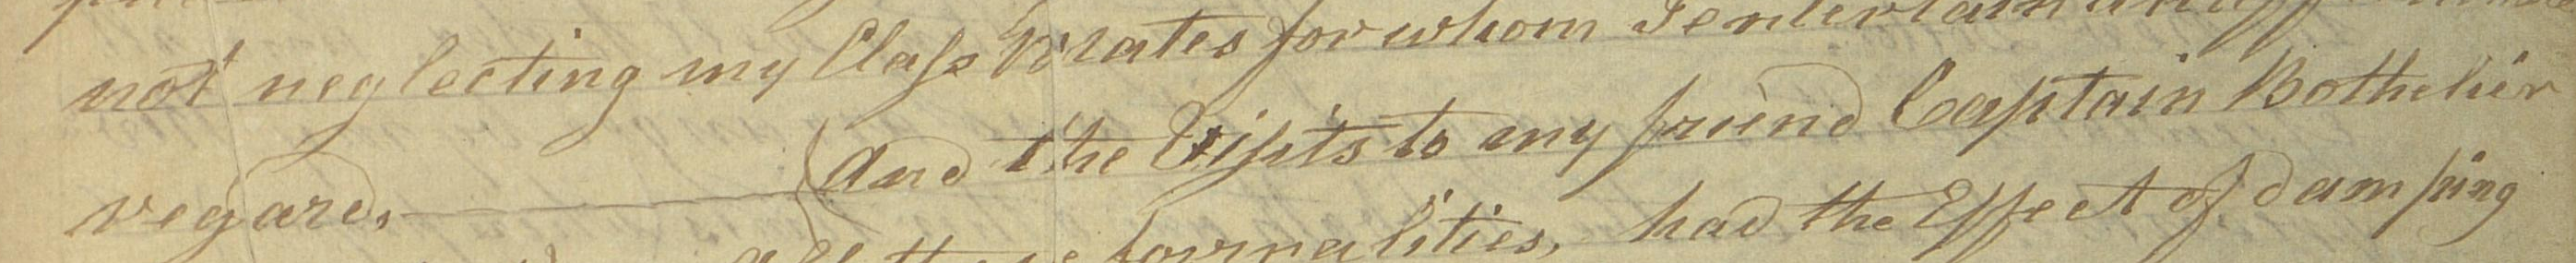regard. (And the Visits to any friend Captain Bothelier
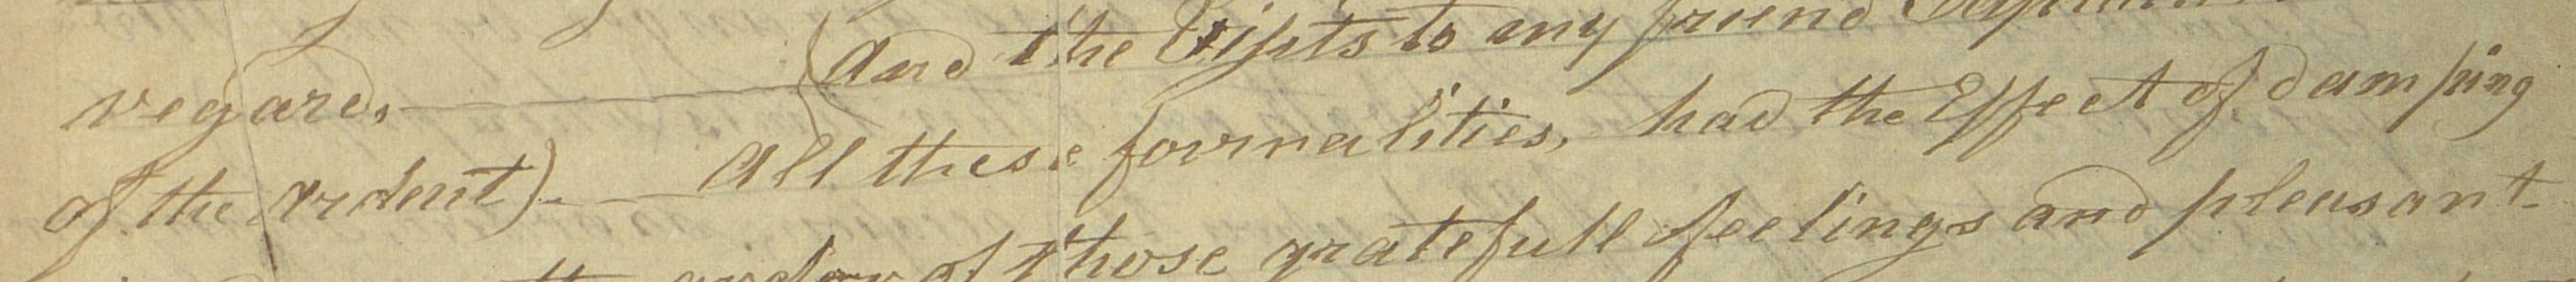of the ardent) All these formalities, had the Effect of damping
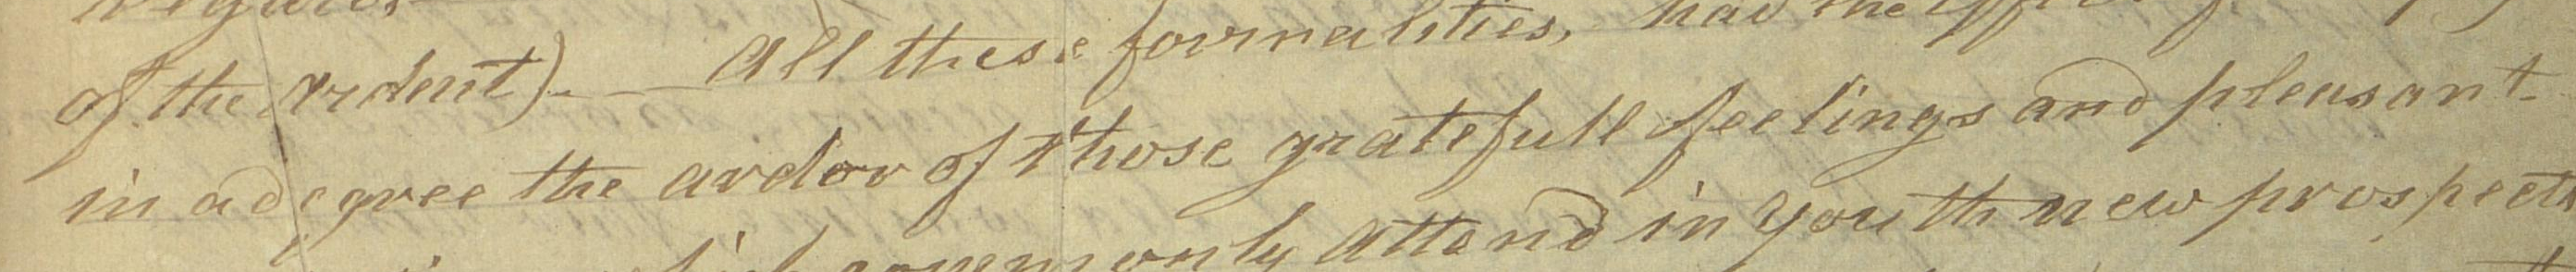in a degree the ardor of those gratefull feelings and pleasant
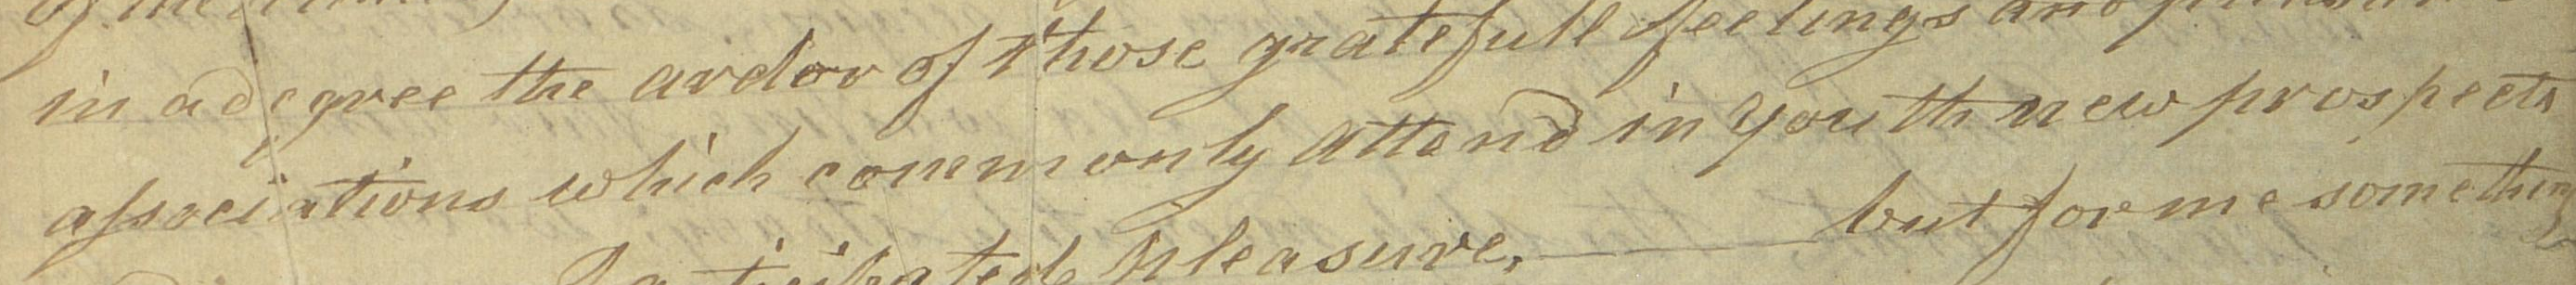associations which commonly attend in youth new prospects
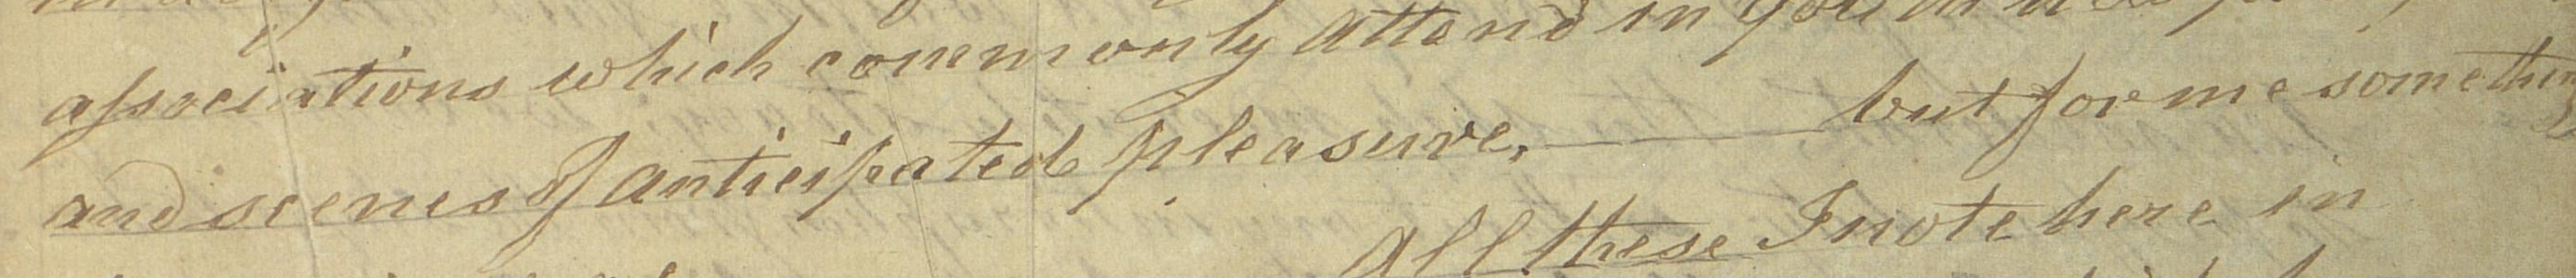and scenes of anticipated pleasure. but for me something
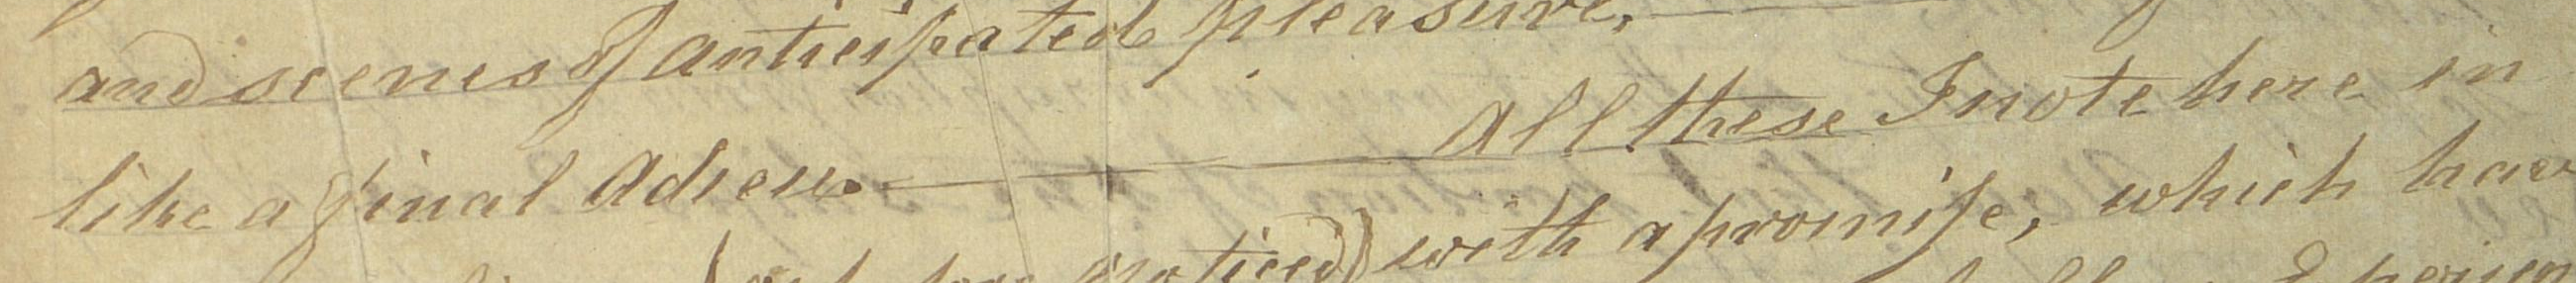like a final Adieu. All these I note here in
